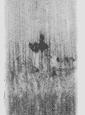十二
